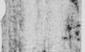從
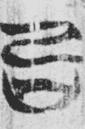己
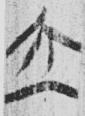立（蒞）
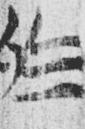於
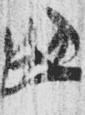廷
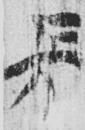長
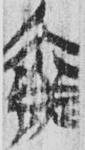魚
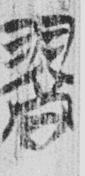翯（矯）
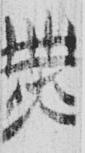典
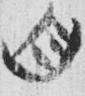自
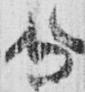公
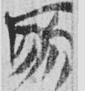所
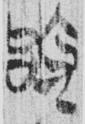敂（拘）
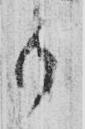人
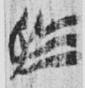於
